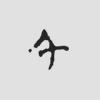千
